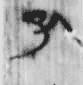孑
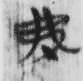弗
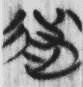﨤（及）
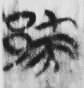邞
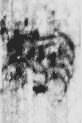○（拳）
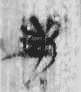未
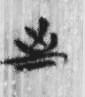至
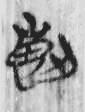○（斷）
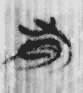有
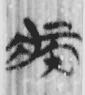疾
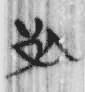死
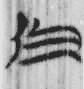於
